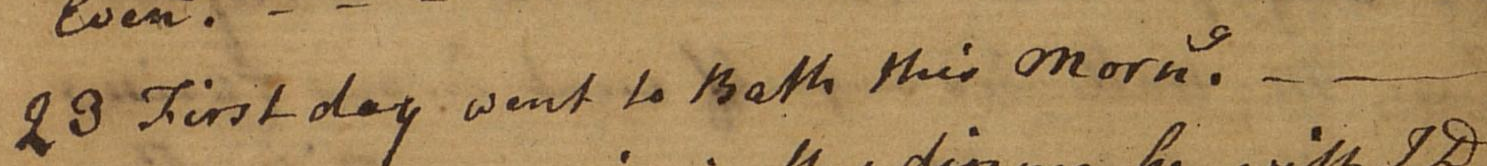23 First day went to Bath this Morn^g.--
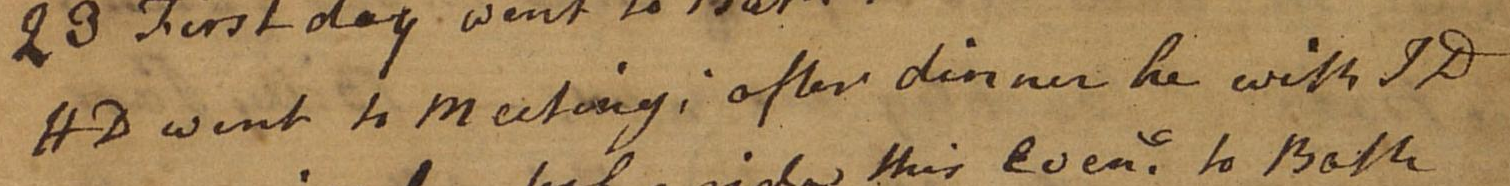HD went to meeting; after dinner he with JD
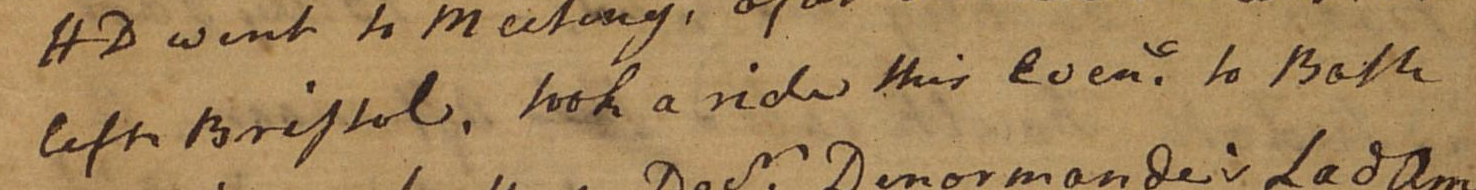left Bristol, took a ride this Even^g. to Bath
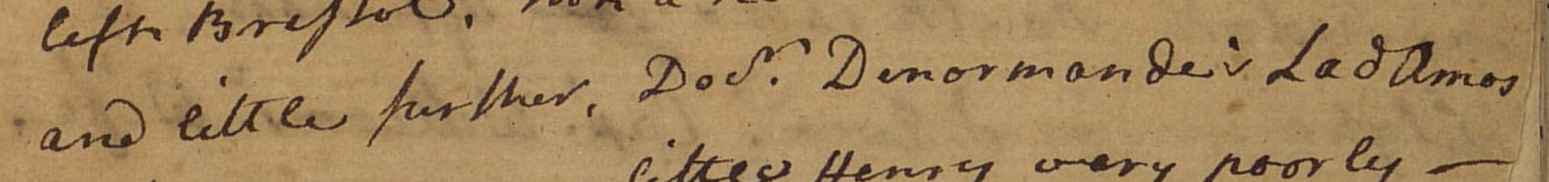and little further, Doc^r. Denormande's Lad Amos
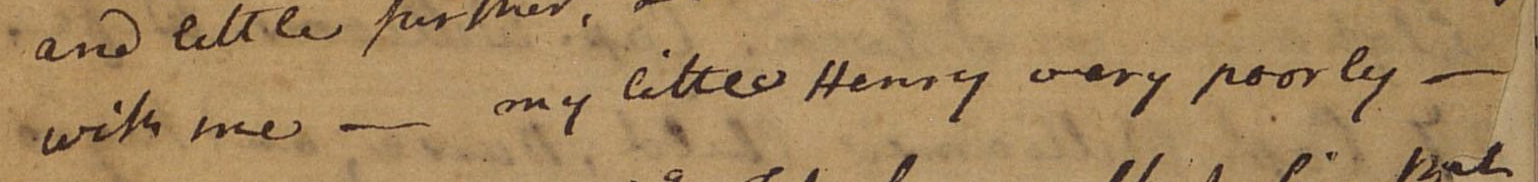with me- my little Henry very poorly-
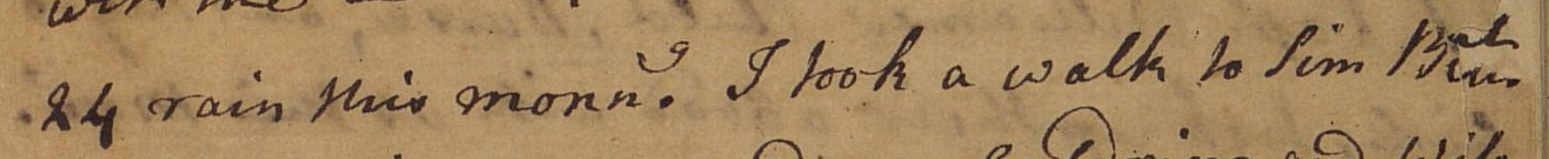24 rain this morn^g. I took a walk to Sim B[e]
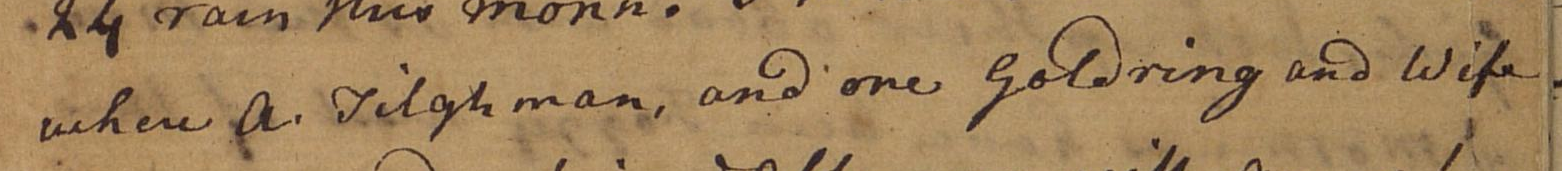where A. Tilghman, and one Goldring and Wi
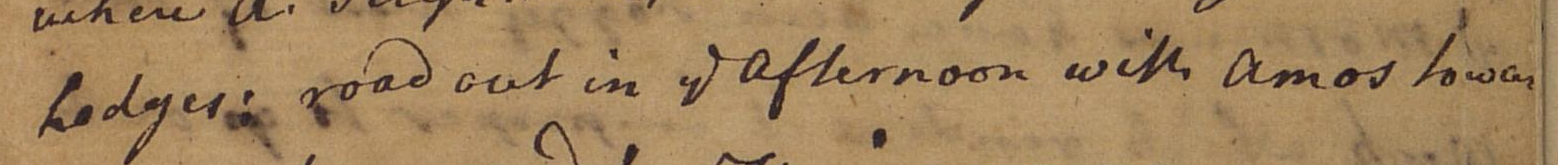Lodges: road out in y^e afternoon with Amos to
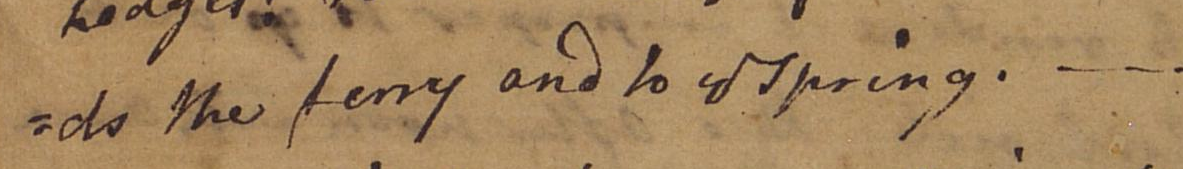-ds the ferry and to y^e spring.-
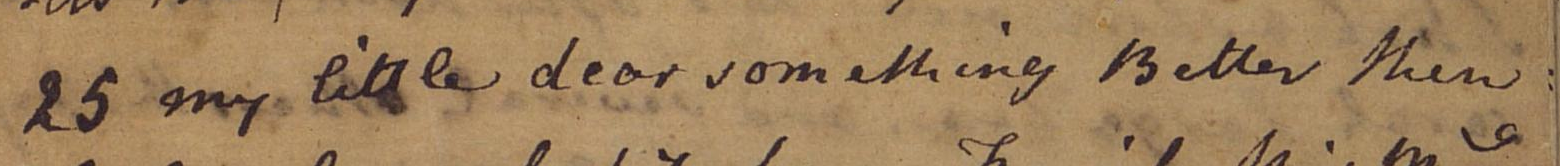25 my little dear something Better then
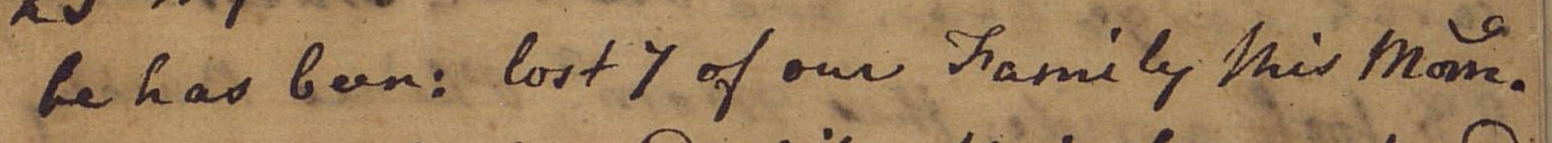he has been: lost 7 of our Family this Morn^g.
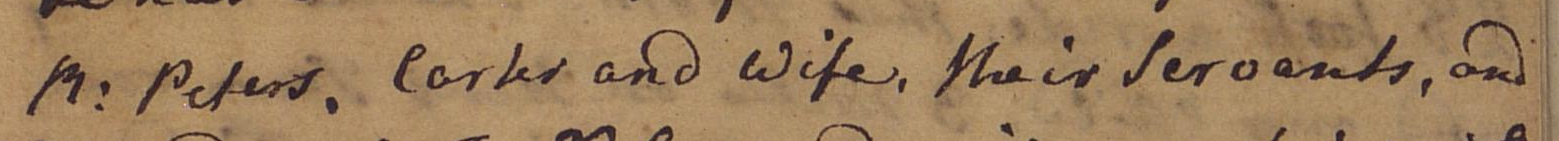M: Peters, Carter and Wife, their Servants, and
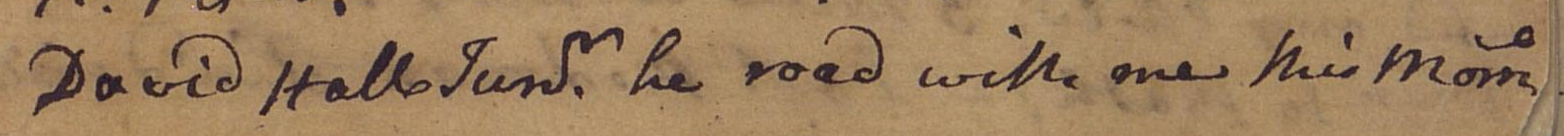David Hall Jun^r. he road with me this morn^g
